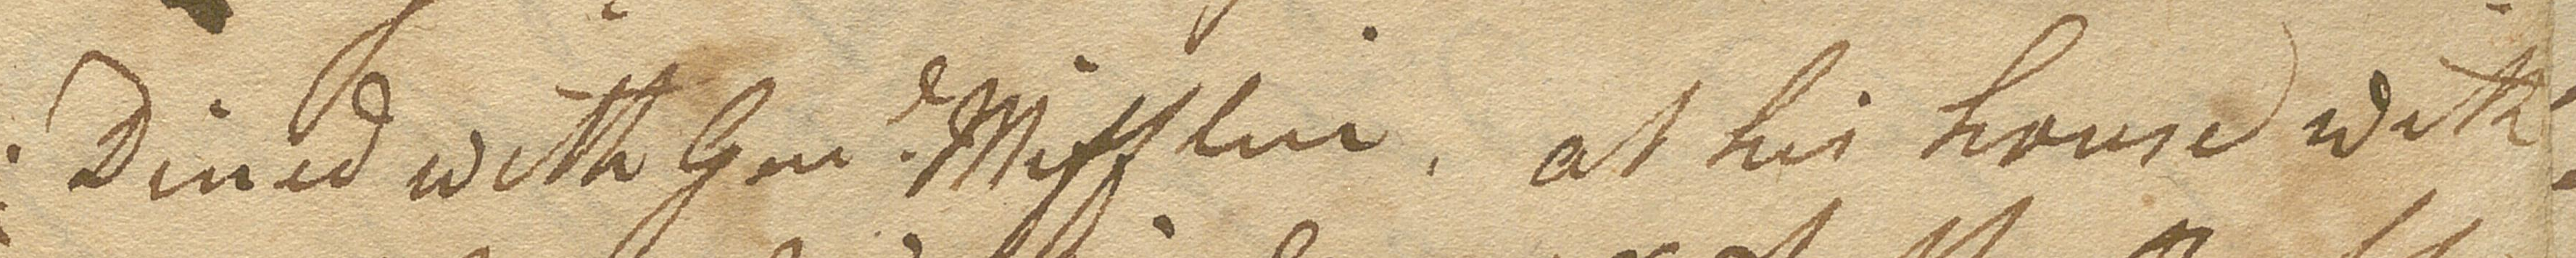Dined with Gen^l. Mifflin, at his house with
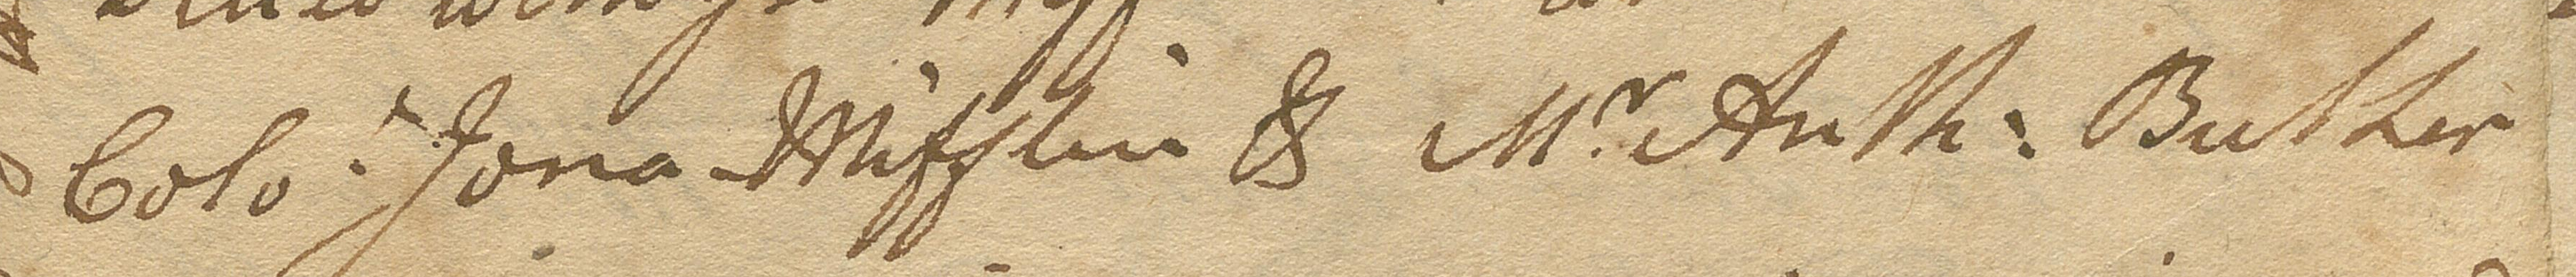Colo^l. Jona Mifflin & M^r. Anth: Butler
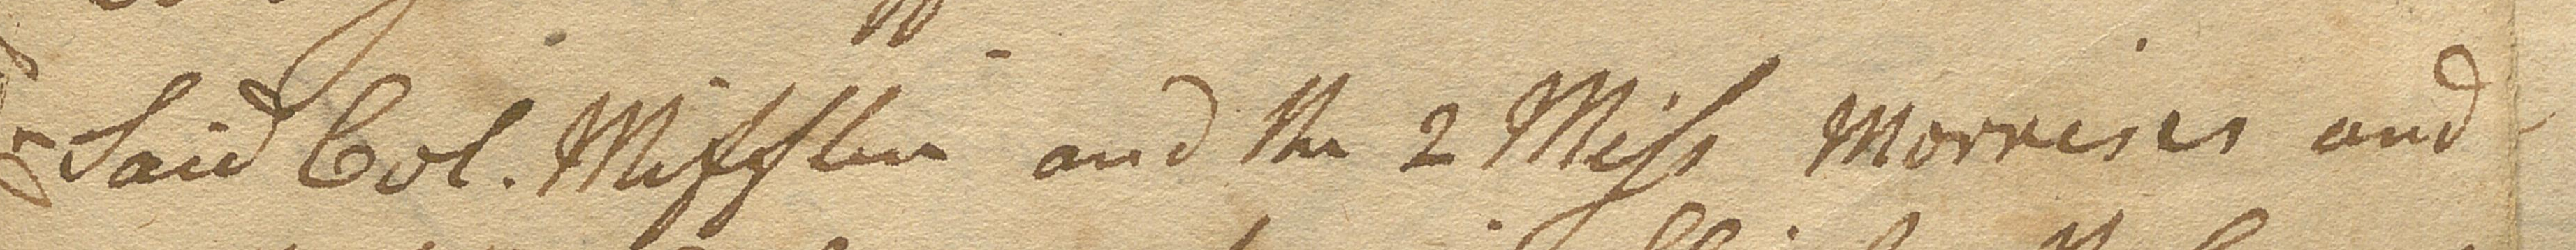Said Col. Mifflin and the 2 Miss Morrises and
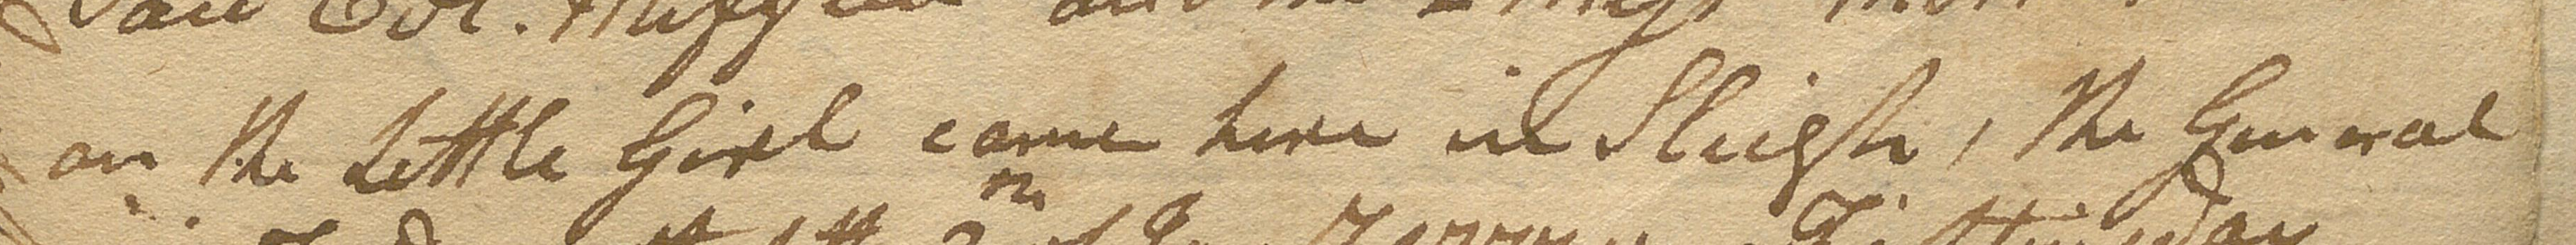on the Little Girl came here in Sleigh, the General
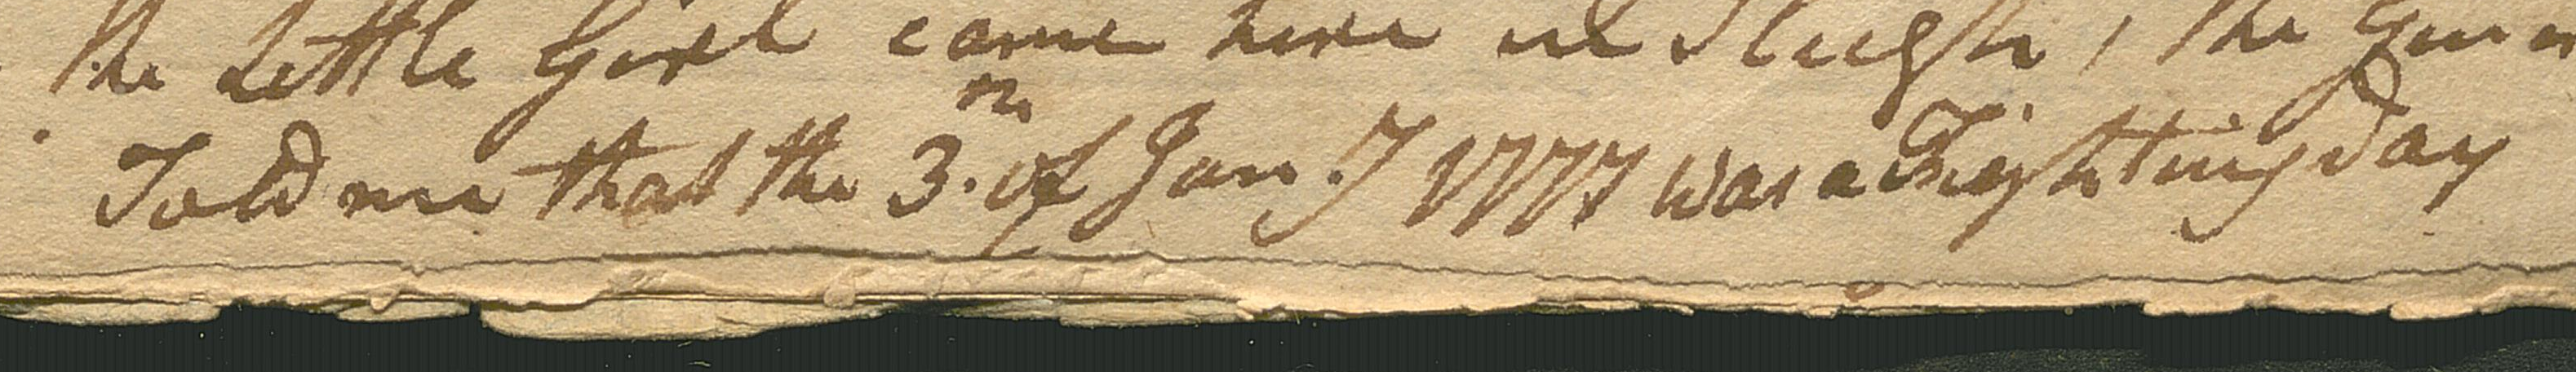Told me that the 3^th. of Jan^y. 1777 was a Fighting day
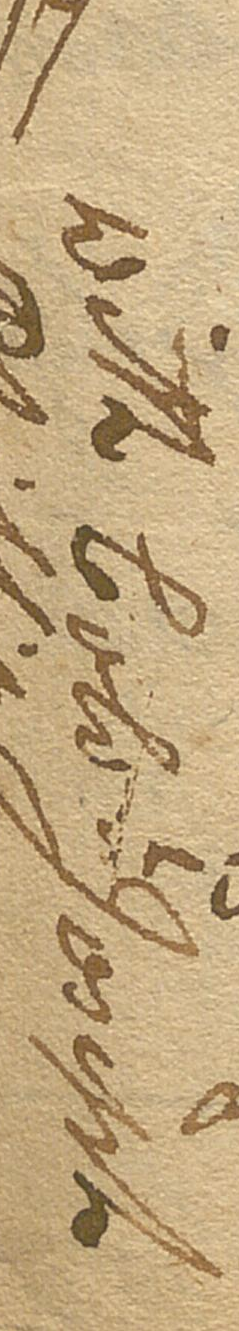with Colo^l. Joseph
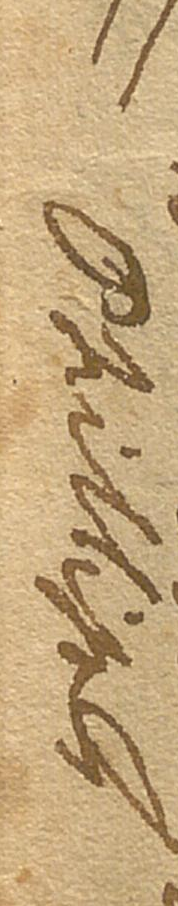Phillipes
